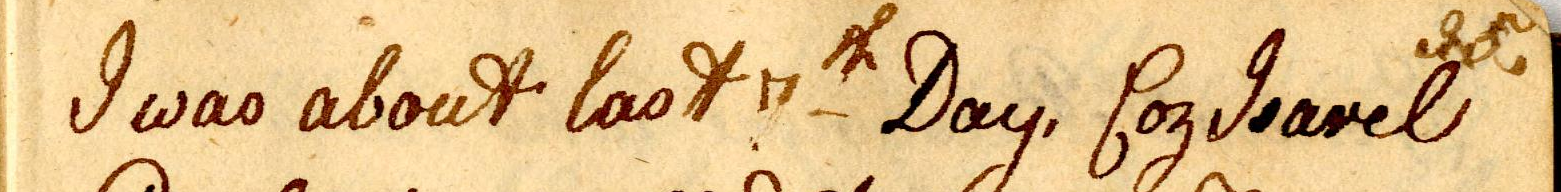I was about last 7^th Day, Coz Isarel
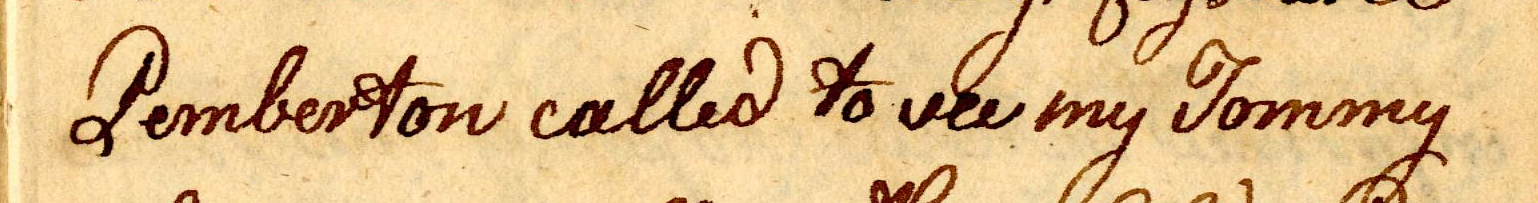Pemberton called to see my Tommy
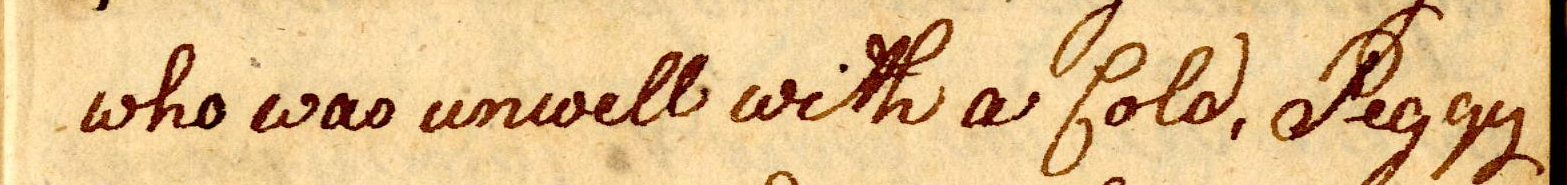who was unwell with a Cold, Peggy
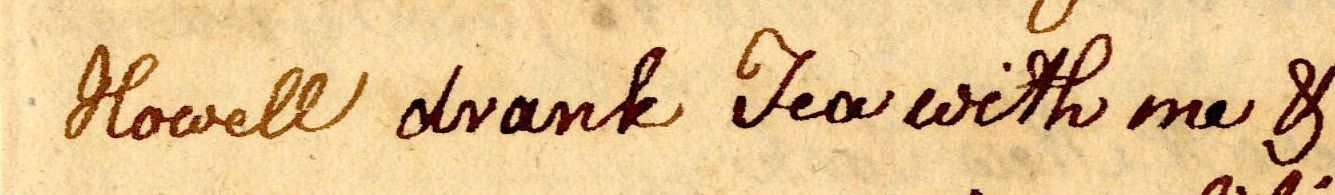Howell drank Tea with me &
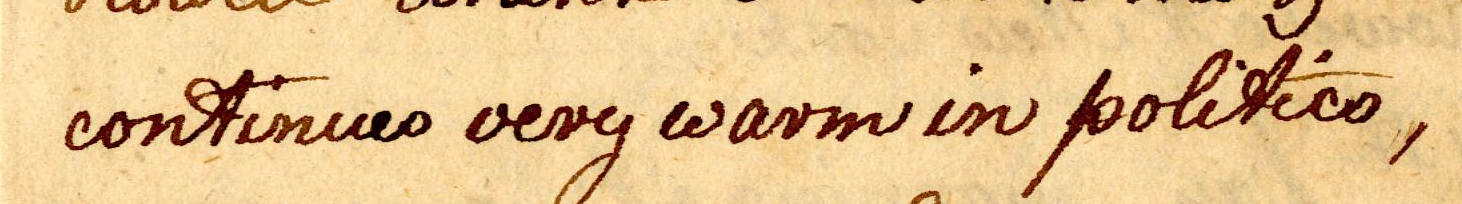continues very warm in politics,
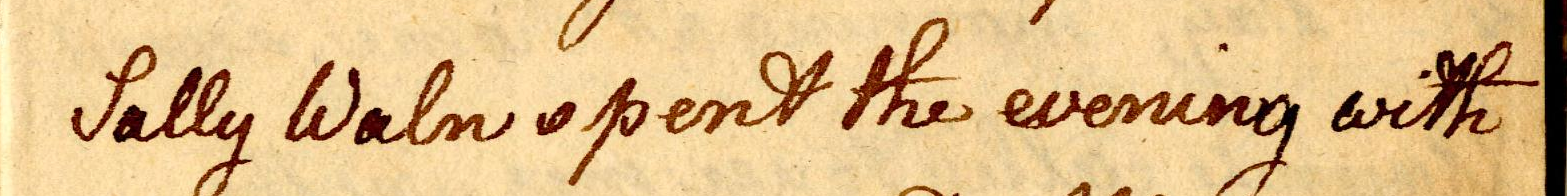Sally Waln spent the evening with
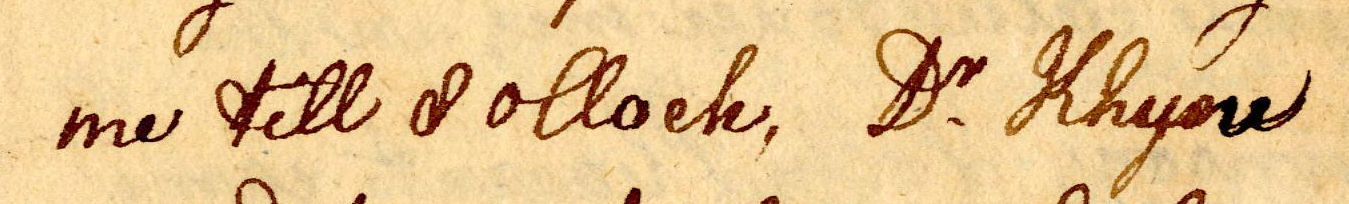me till 8 ^oClock, D^r Khyne
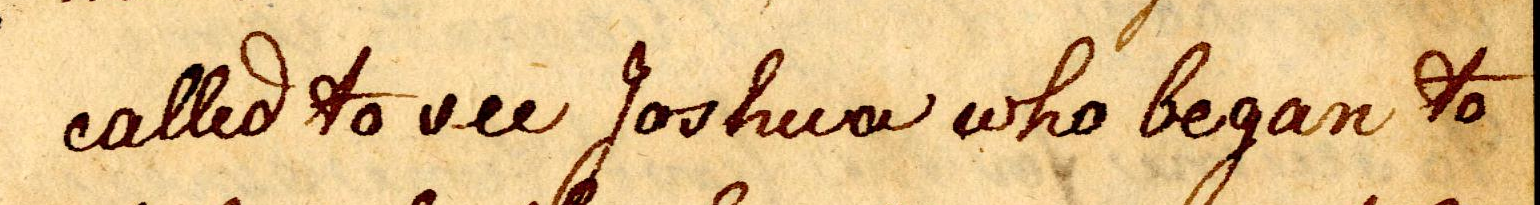called to see Joshua who began to
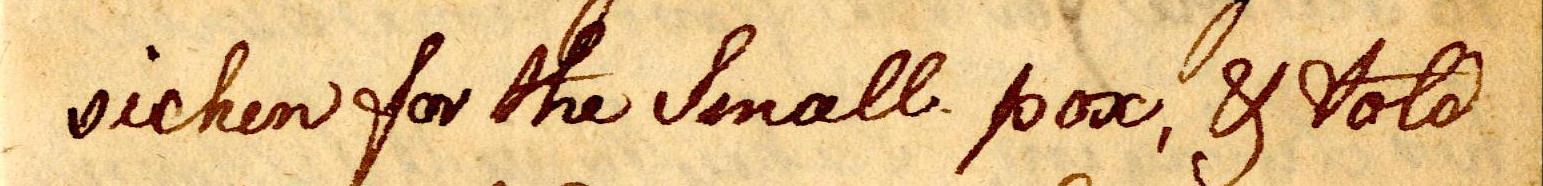sicken for the Small pox, & told
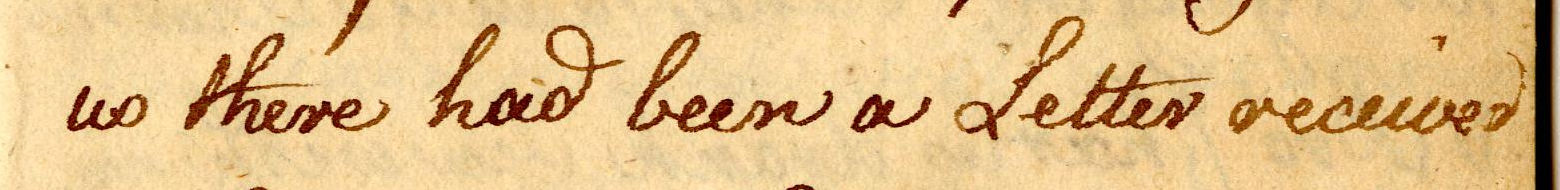us there had been a Letter received
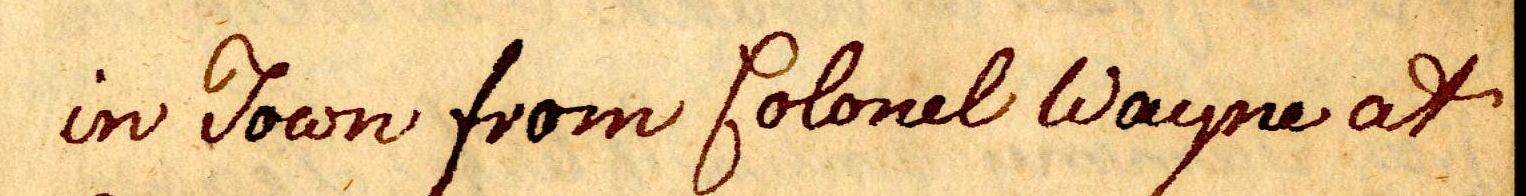in Town from Colonel Wayne at
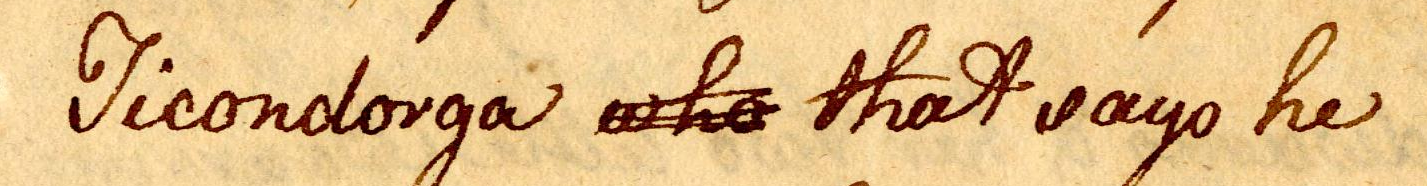Ticondorga [who] that says he
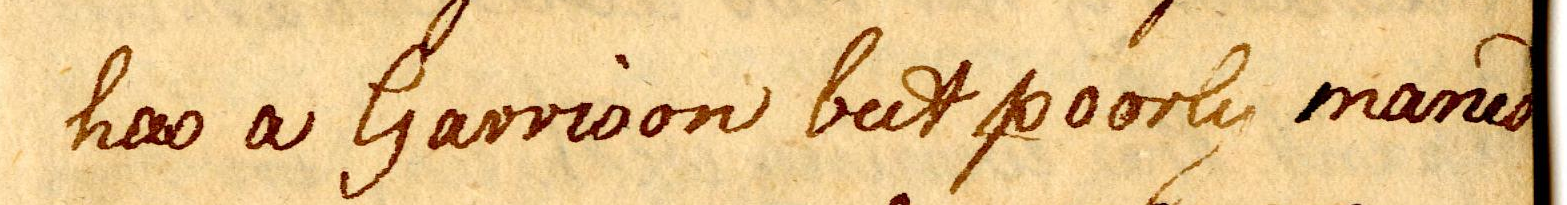has a Garrison but poorly maned
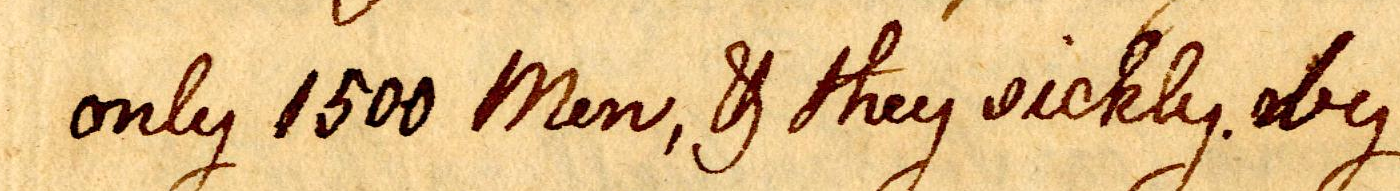only 1500 Men, & they sickly by
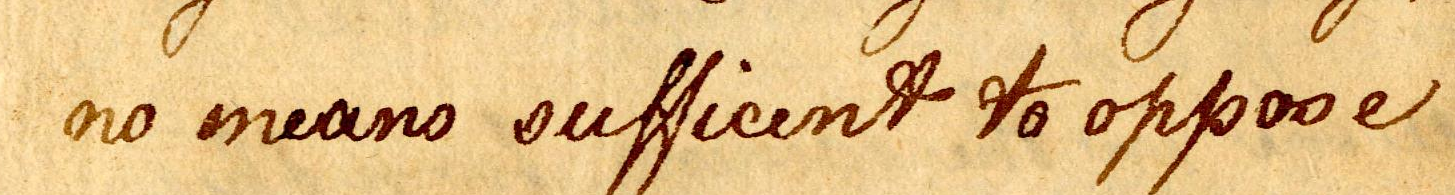no means sufficent to oppose
